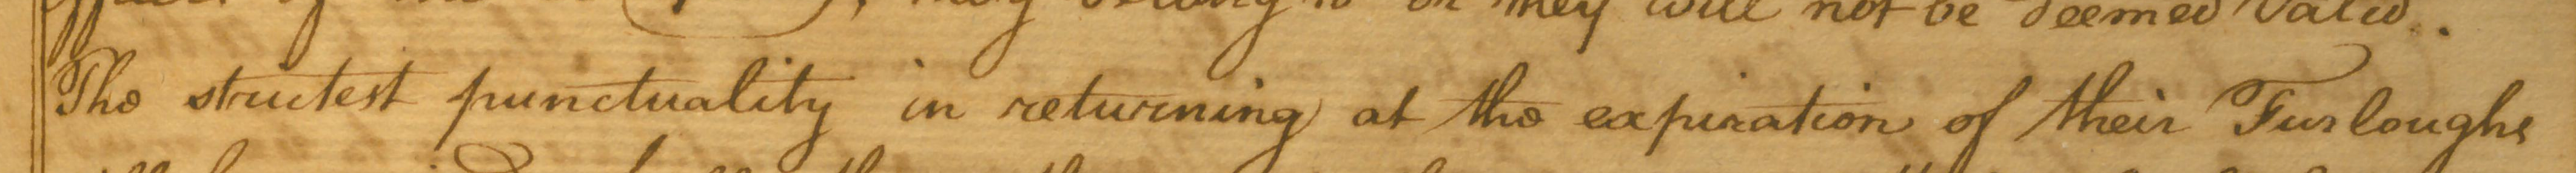The strictest punctuality in returning at the expiration of their Furloughs
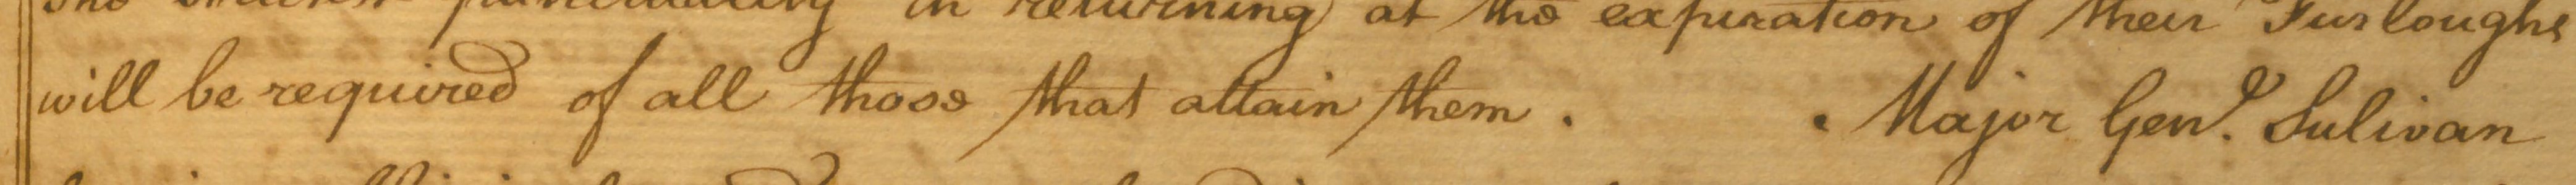will be required of all those that attain them. Major Gen^l. Sullivan
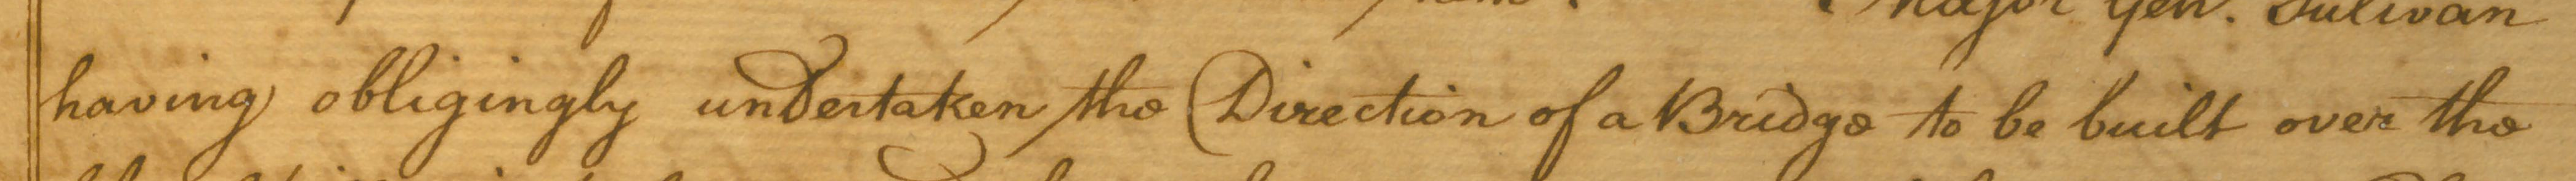having obligingly undertaken the Direction of a Bridge to be built over the
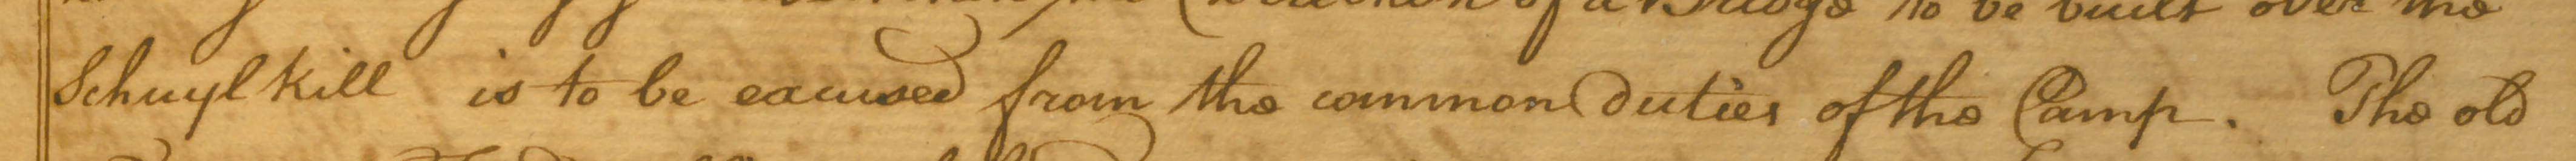Schuylkill is to be excused from the common duties of the Camp. The old
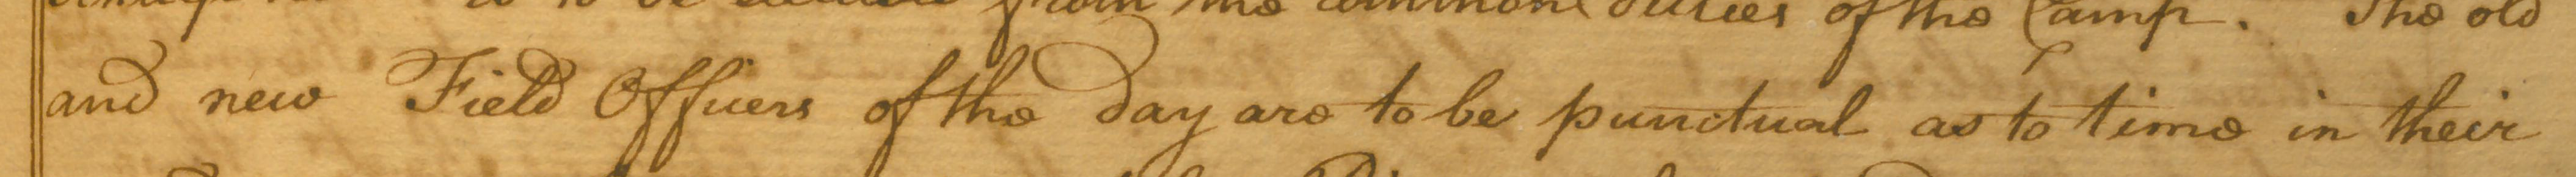and new Field Officers of the day are to be to be punctual as to time in their
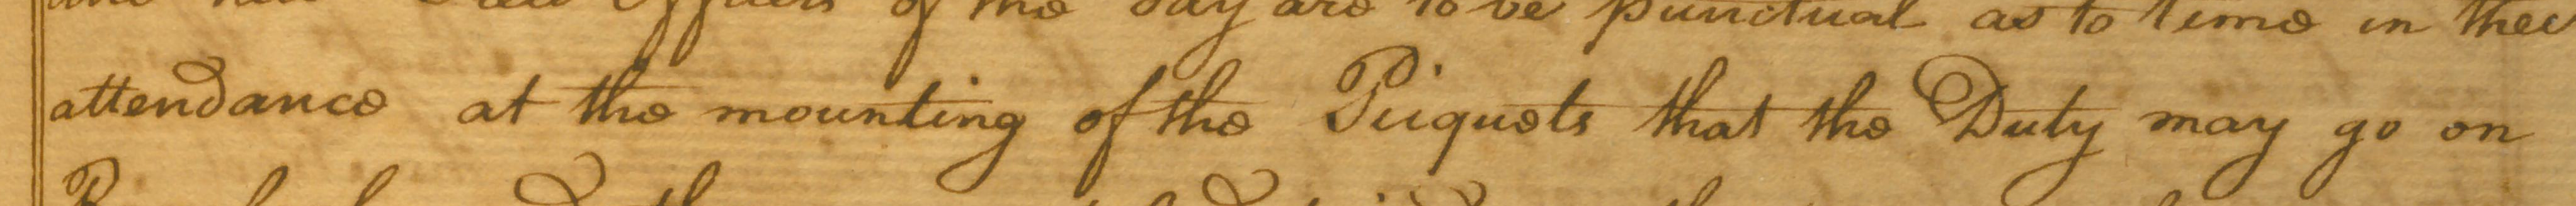attendance at the mounting of the Picquets that the Duty may go on
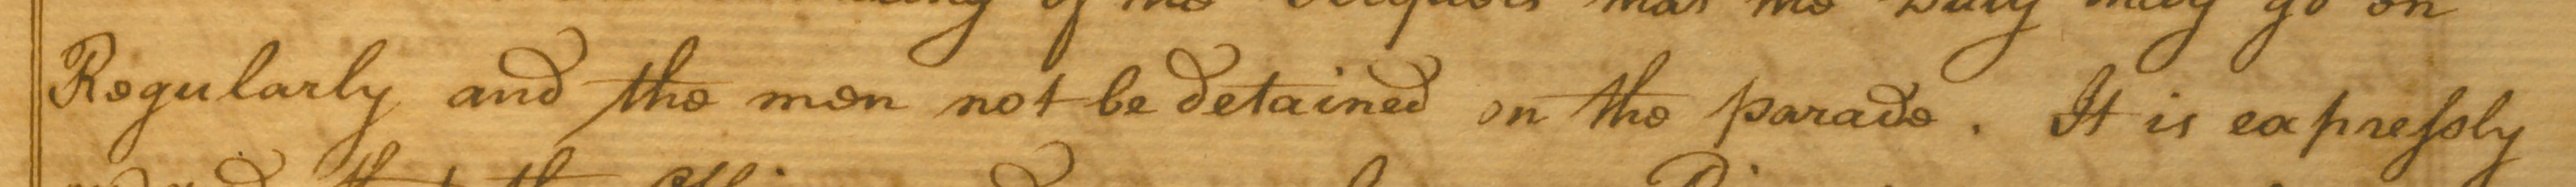Regularly and the men not be detained in the parade. It is expressly
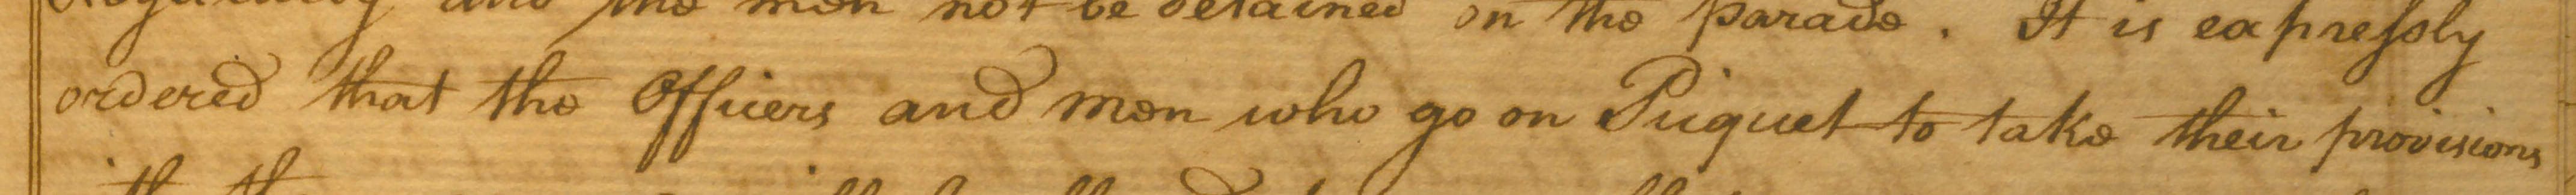ordered that the Officers and men who go on Picquet to take their provisions
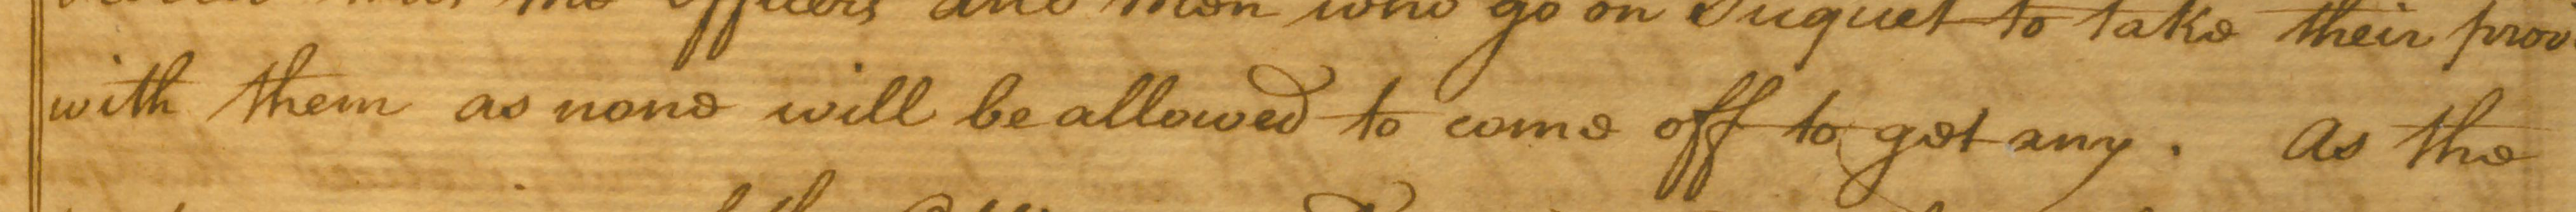with them as none will be allowed to come off to get any. As the
